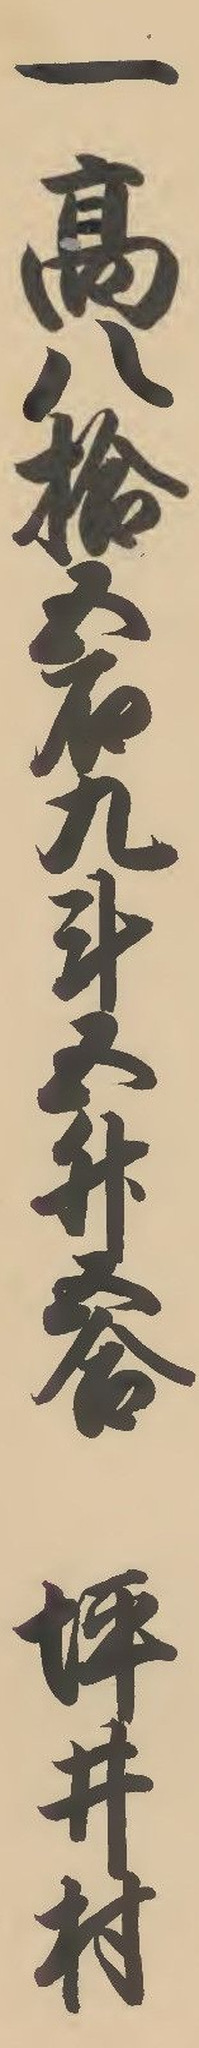一髙八拾五石九斗五升五合坪井村

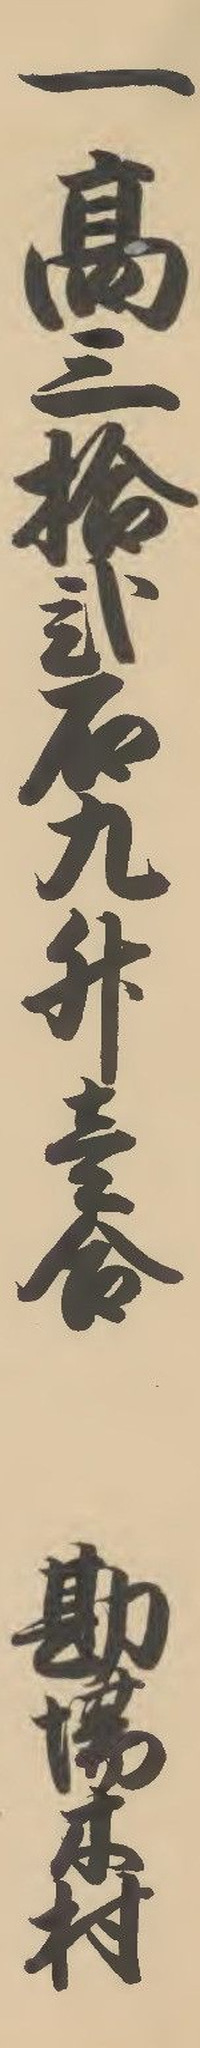一髙三拾弐石九升壱合勘場木村
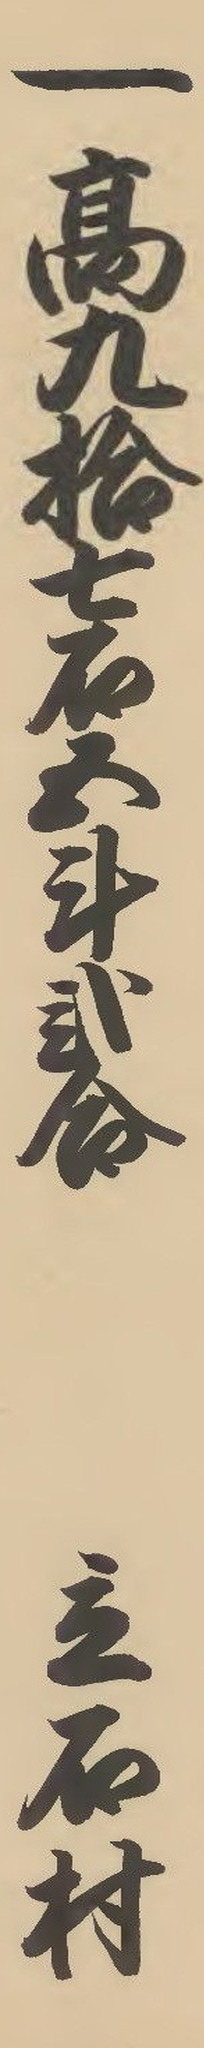一髙九拾七石五斗弐合立石村
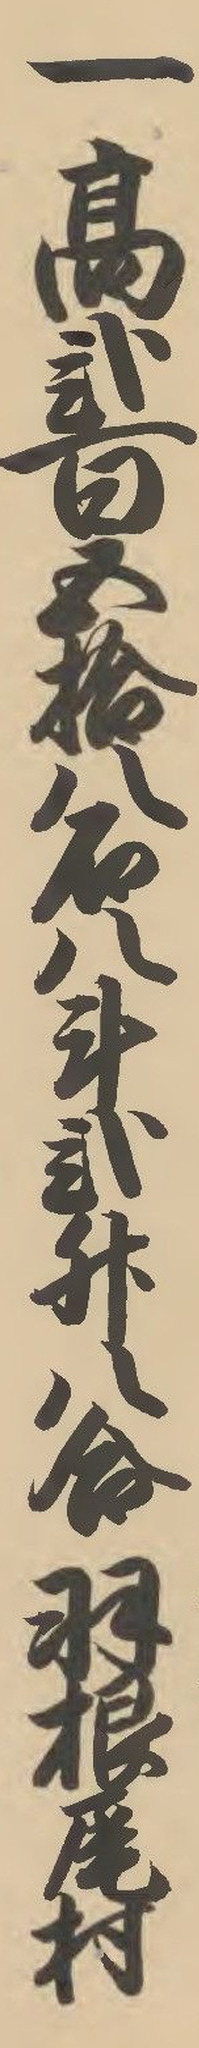一髙弐百五拾八石八斗弐升八合羽根尾村
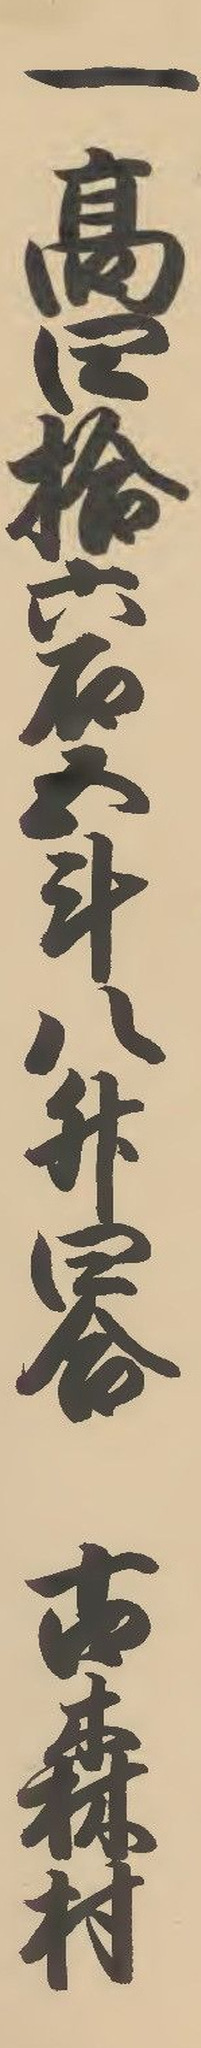一髙四拾六石五斗八升四合古森村
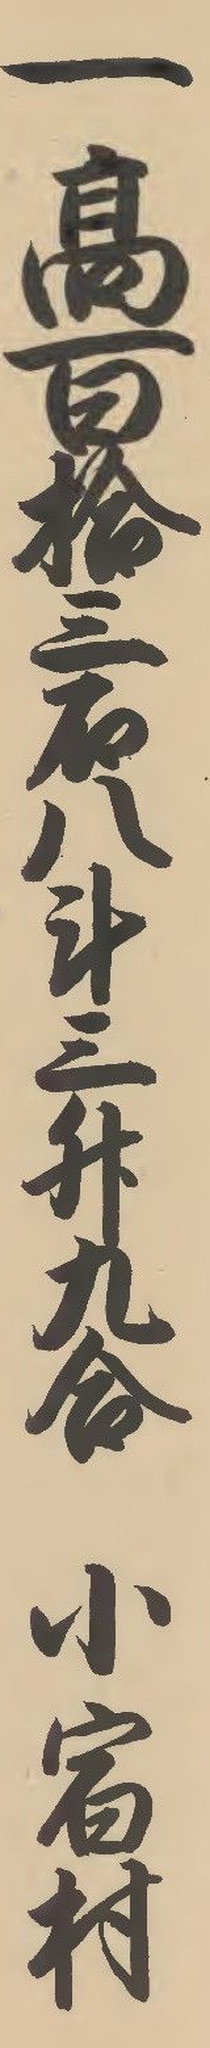一髙百拾三石八斗三升九合小宿村
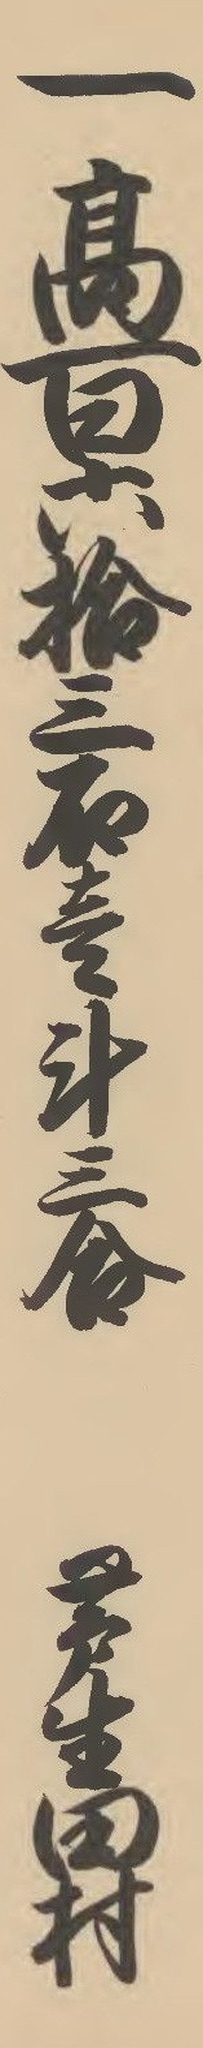一髙百六拾三石壱斗三合生田村
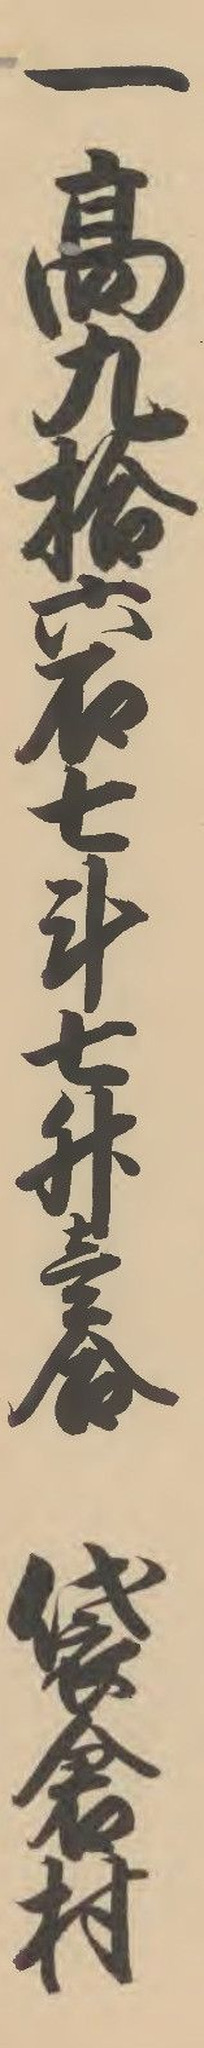一髙九拾六石七斗七升壱合袋倉村

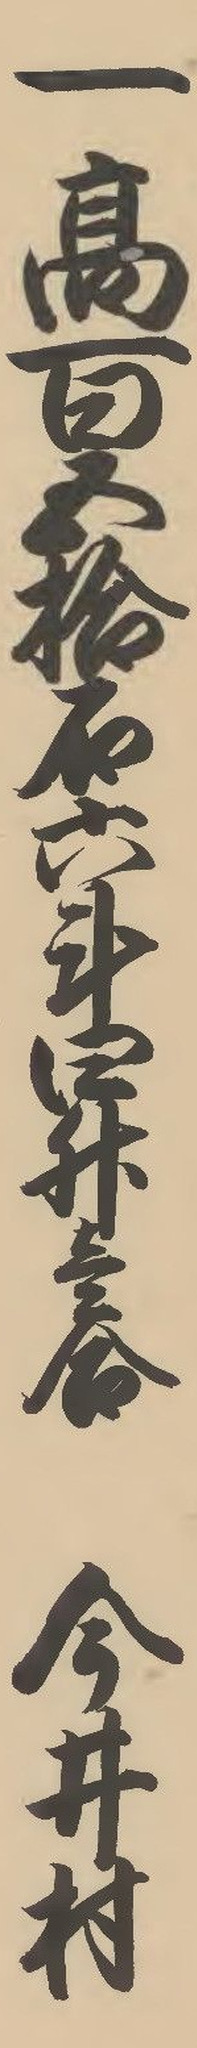一髙百五拾石六斗四升壱合今井村
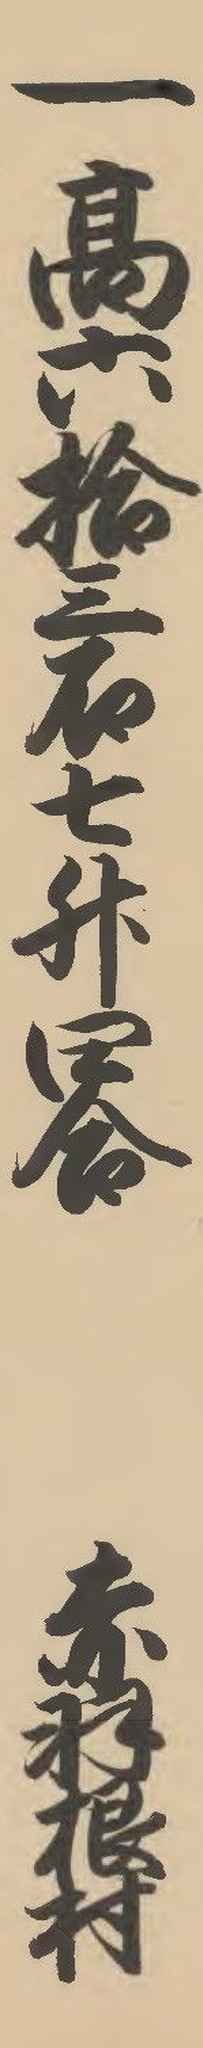一髙六拾三石七升四合赤羽根村
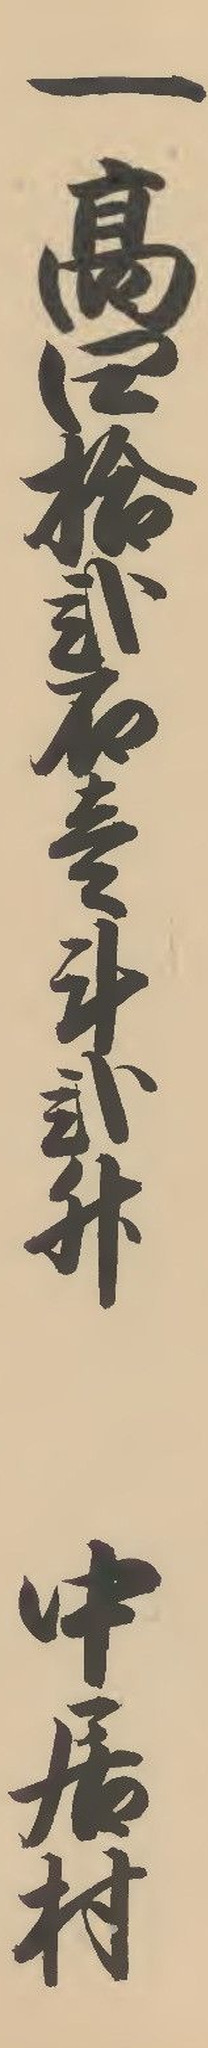一髙四拾弐石壱斗弐升中居村
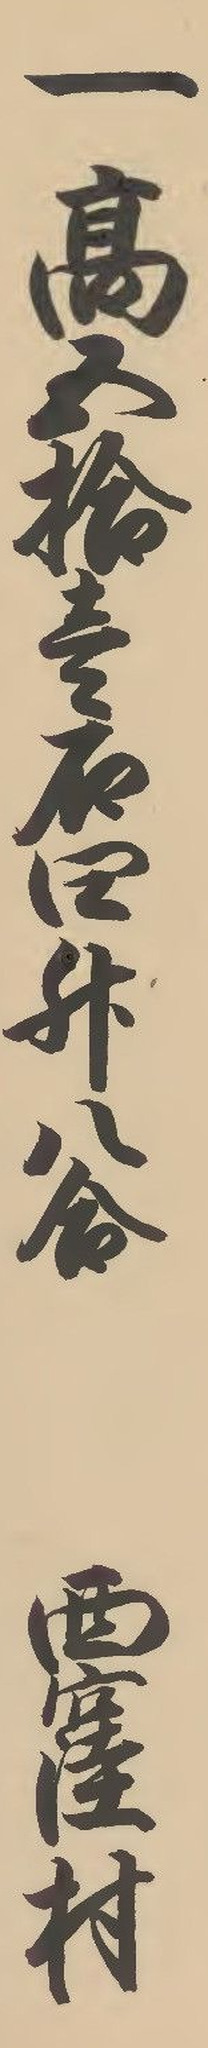一髙五拾壱石四升八合西窪村
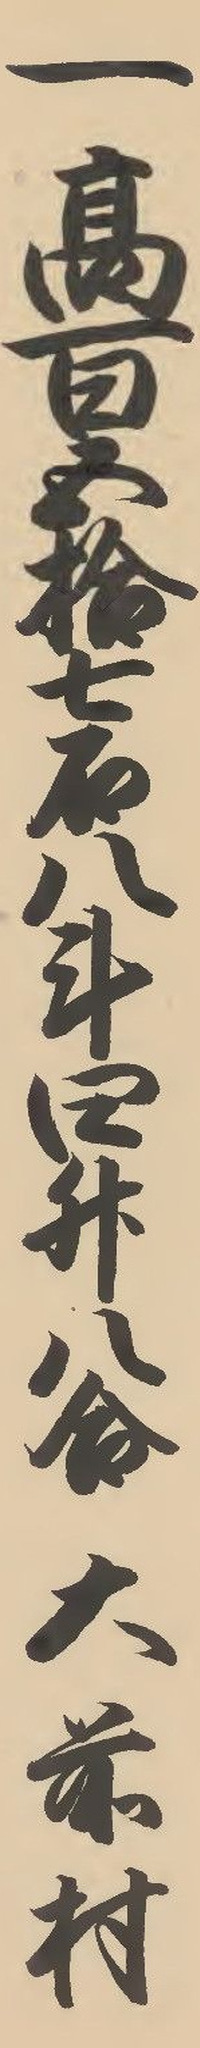一髙百五拾七石八斗四升八合大前村
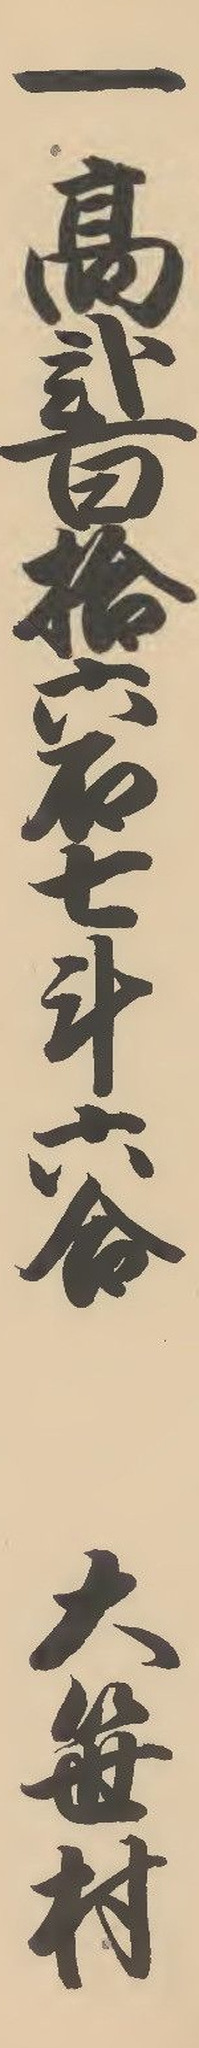一髙弐百拾六石七斗六合大笹村
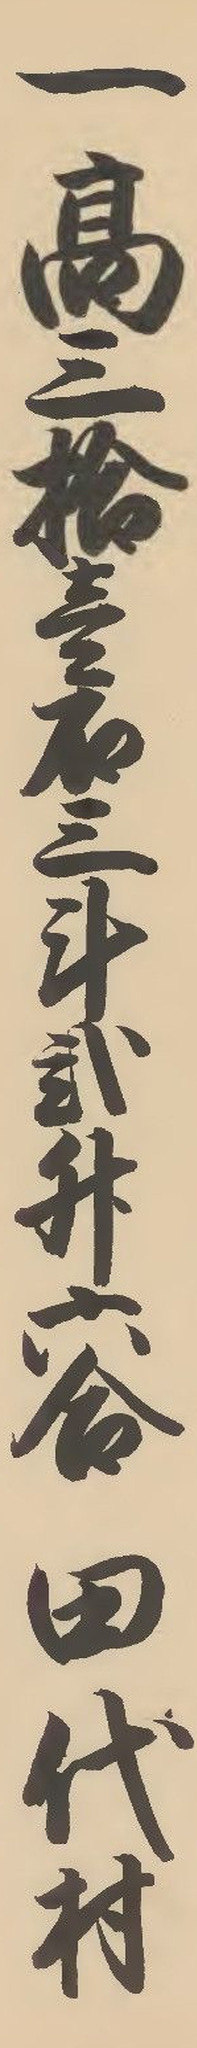一髙三拾壱石三斗壱升六合田代村
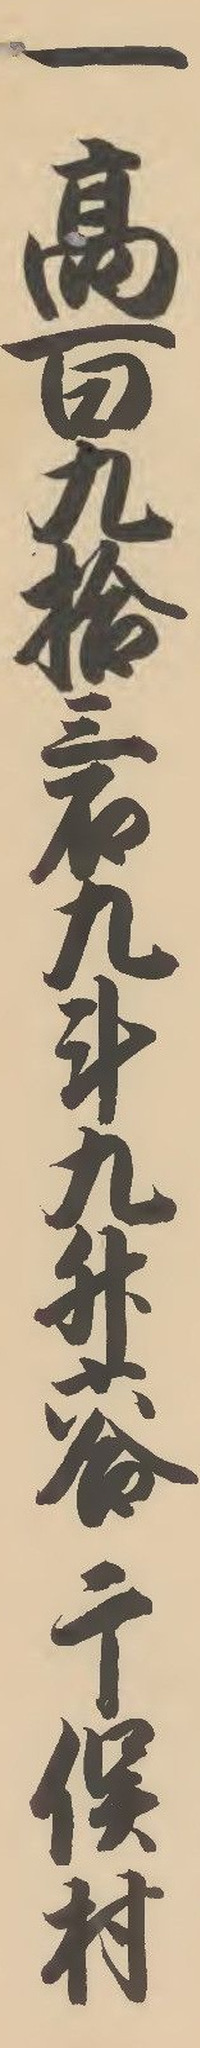一髙百九拾三石九斗九升六合干俣村
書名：上野国郷帳
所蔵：国立公文書館 National Archives of Japan
